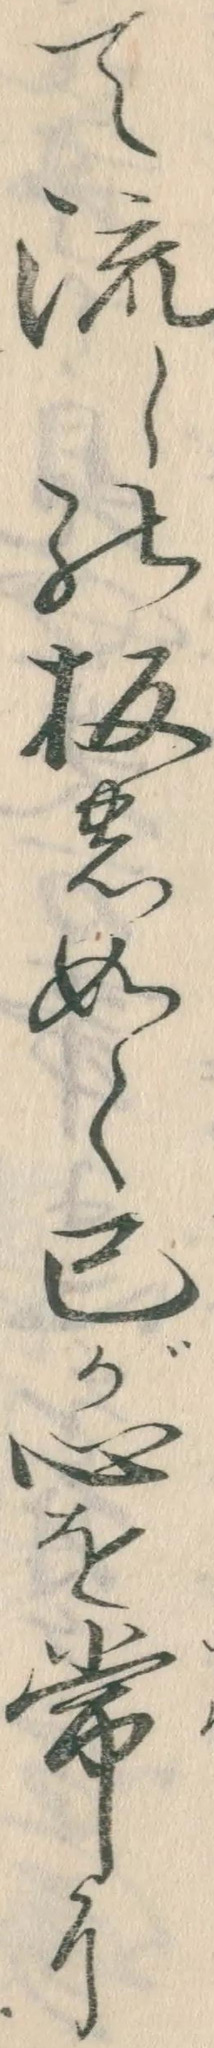て流しの板農如く己が心を常に
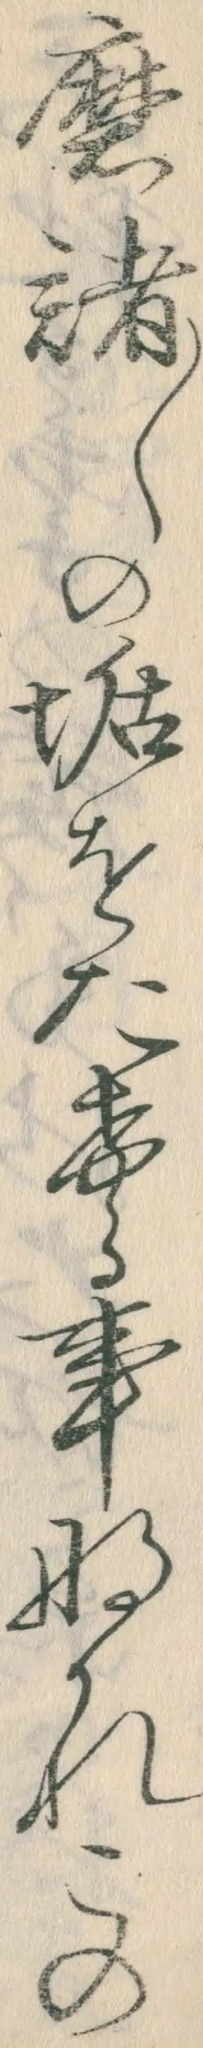磨諸〳〵の垢をたける事なかれこの
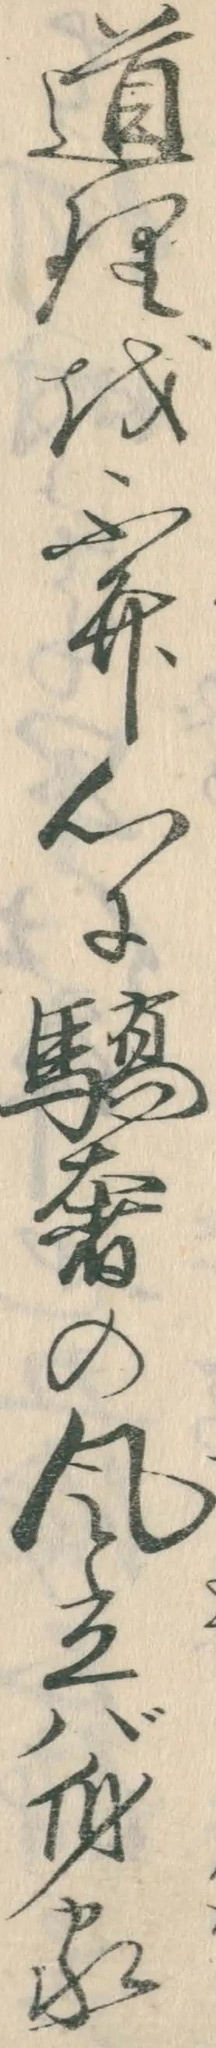道理を不弁心に驕奢の風立ば身家

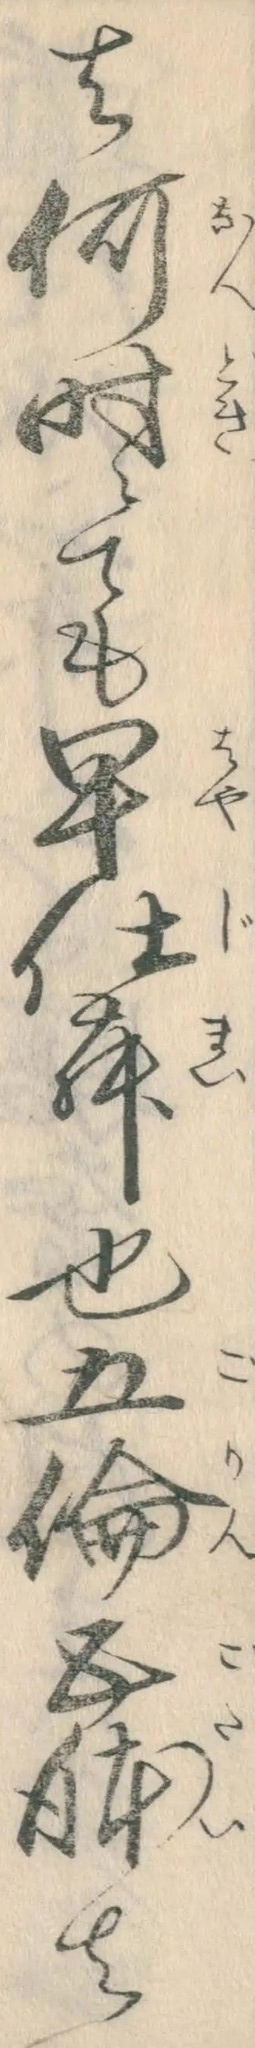は何時にても早仕舞也五倫五体は
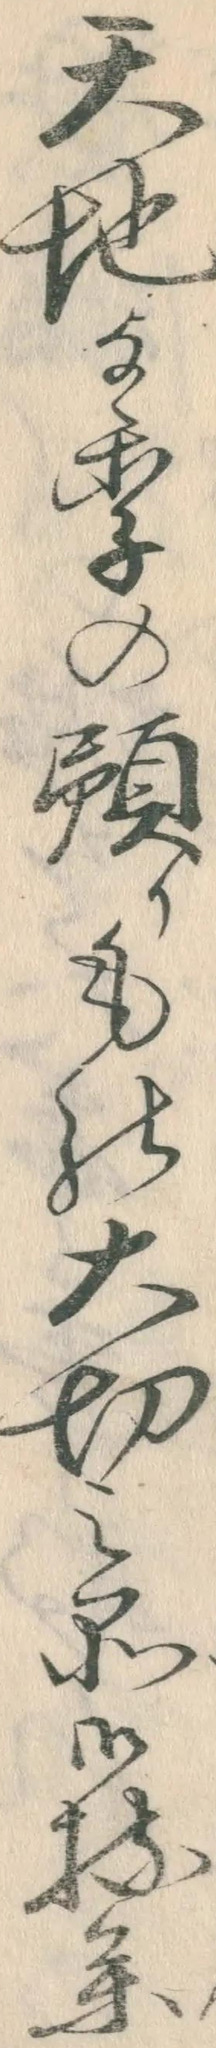天地よ李の預りもの大切之品御持参
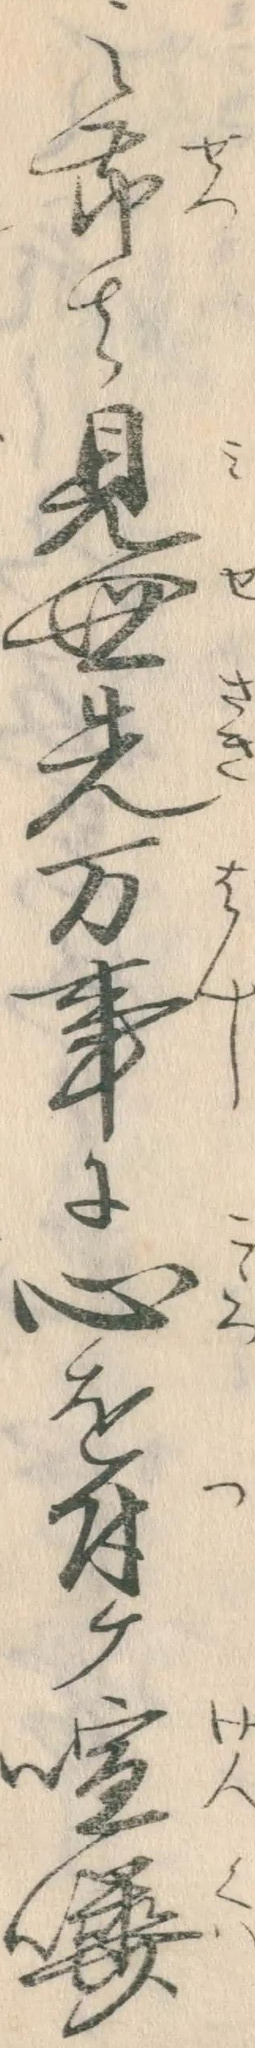之節は見世先万事に心を付喧嘩
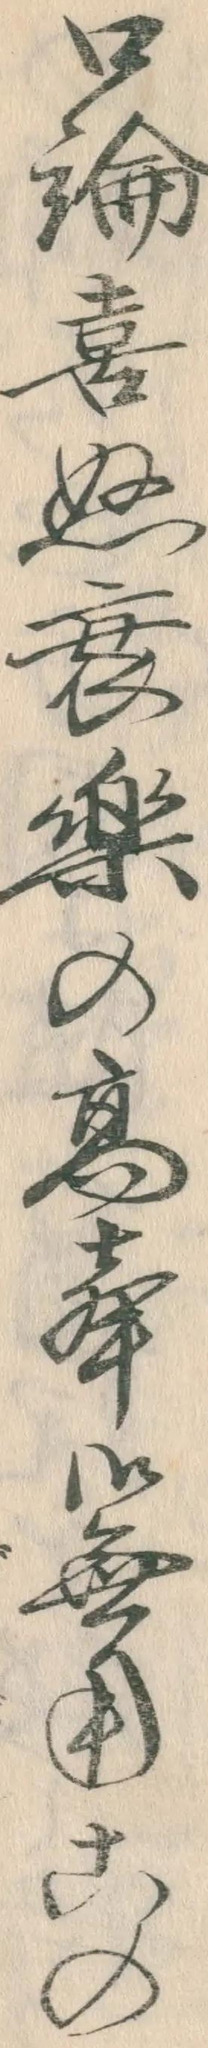口論喜怒哀楽の高声御無用この
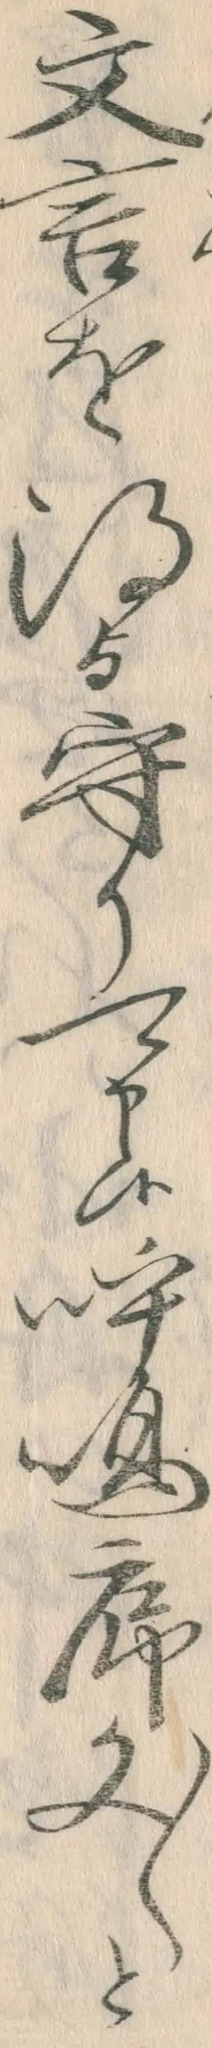文言を得と守り可申候呼鳴序文〳〵と
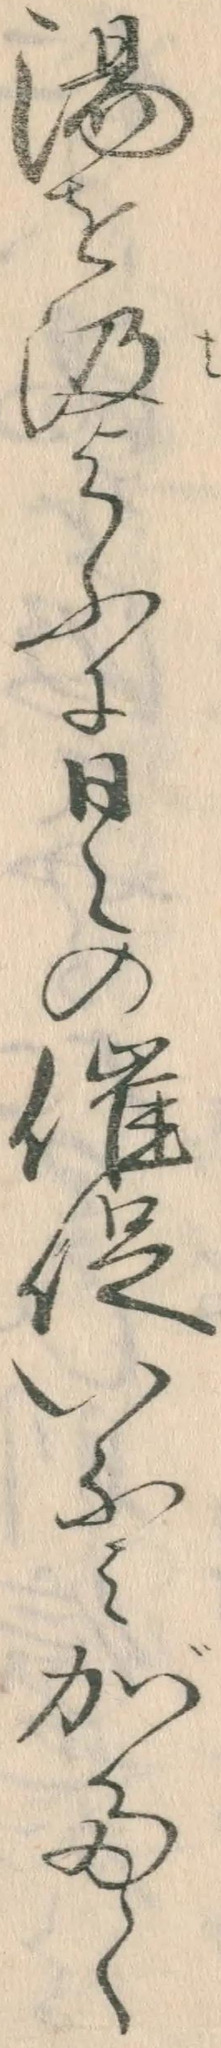湯を汲よふに日々の催促いなみがたく
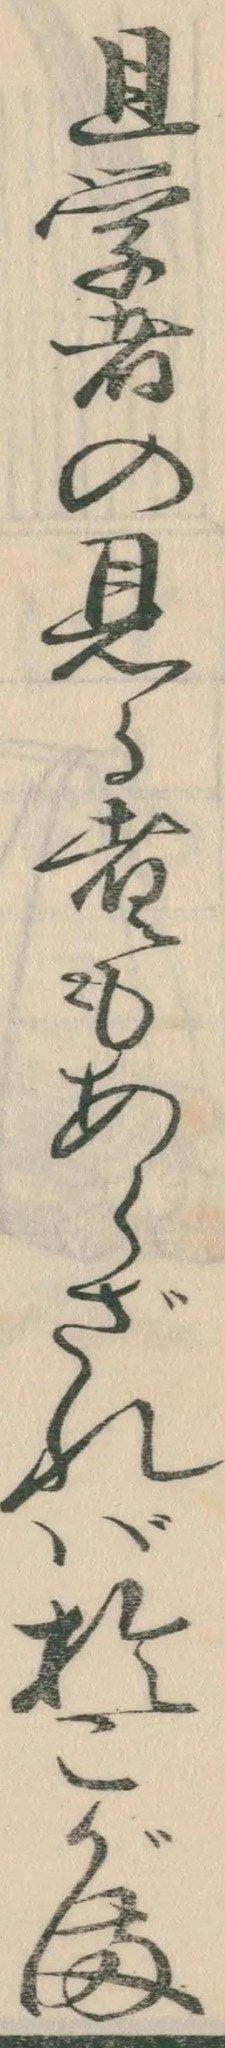且学者の見る者もあらざればおこがま
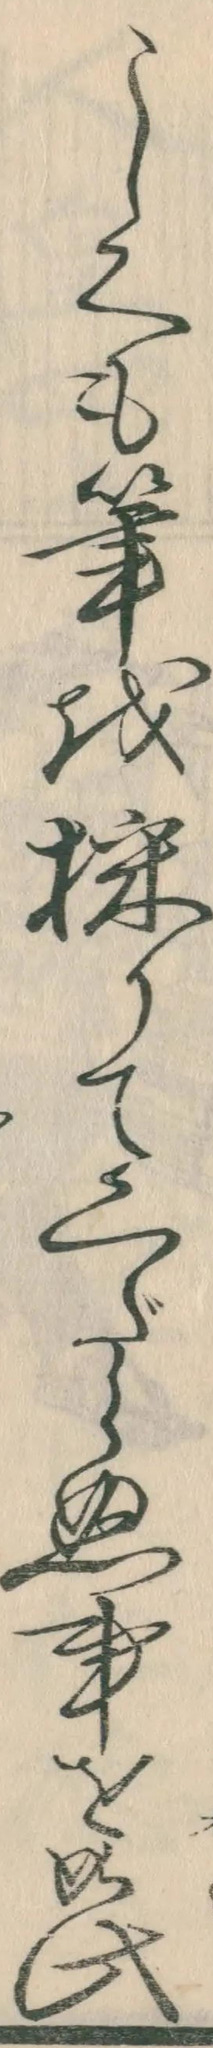しくも筆を採りてくだらぬ事を如此
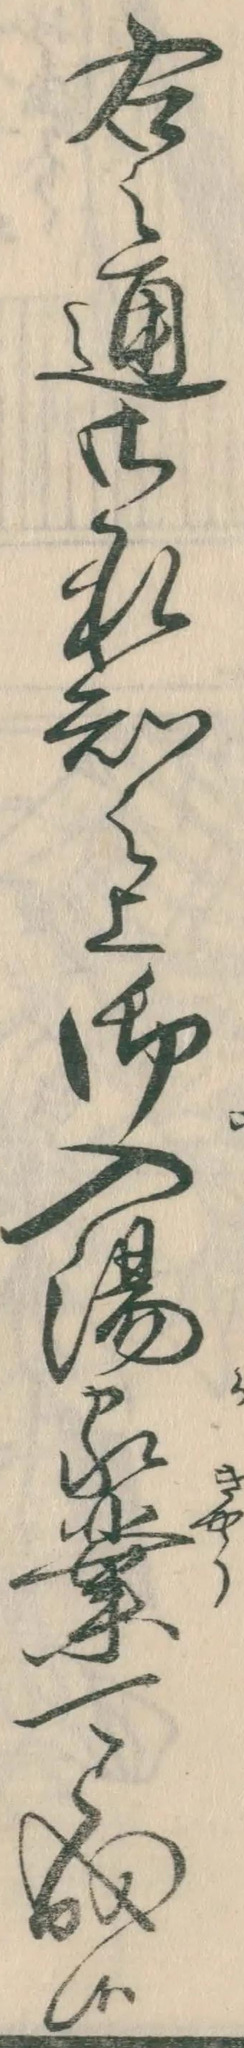右之通御承知之上御入湯家業可被成候
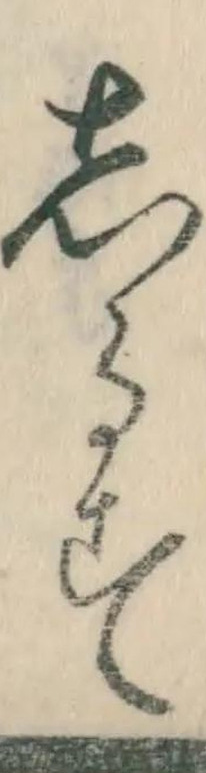しるす

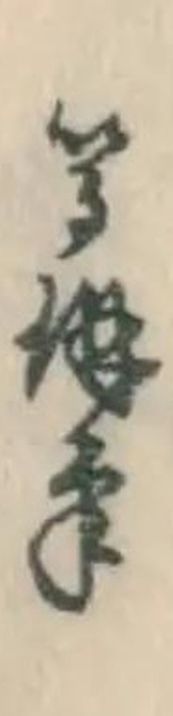等琳筆
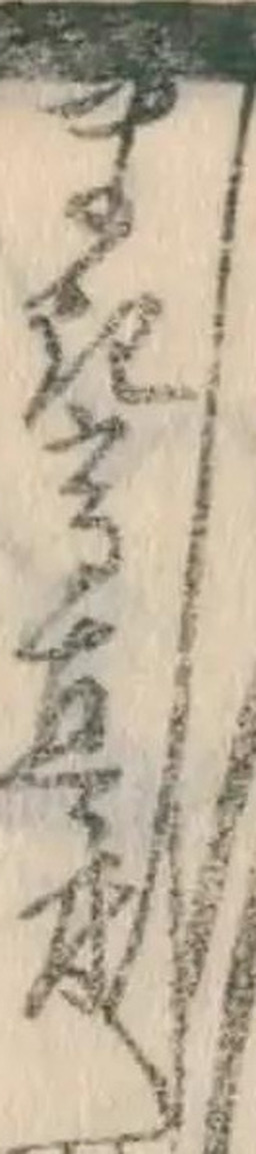まき高直に付
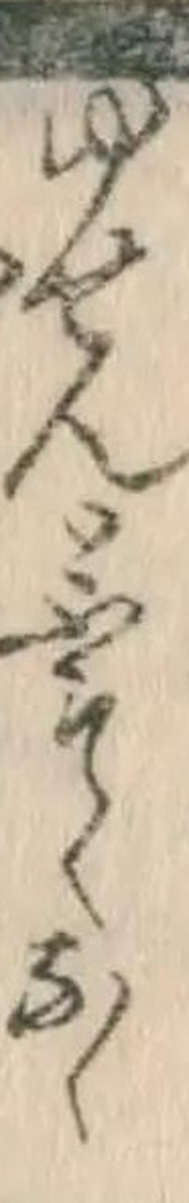ゆせん御ふそくなく
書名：洗湯手引草
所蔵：国立国会図書館 National Diet Library, JAPAN
